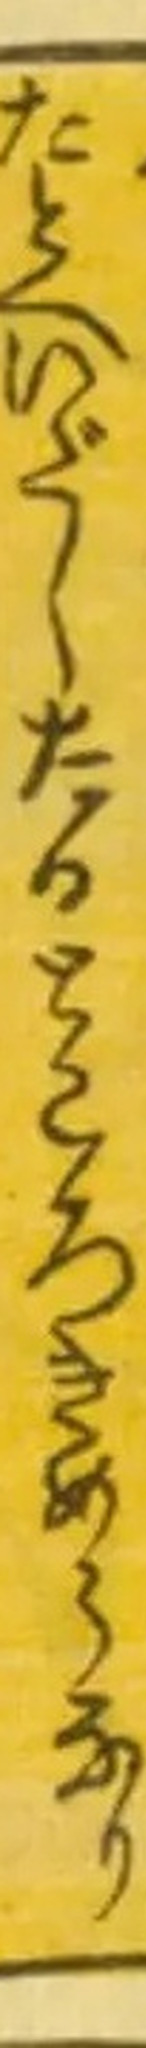たとへいだしたるところきめうなり
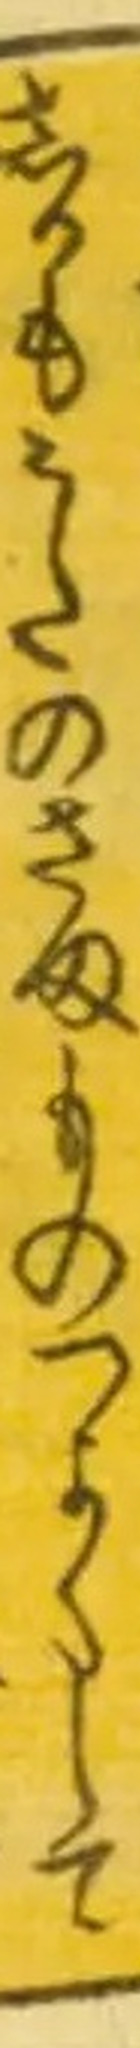しかもうたのさまものつよくして
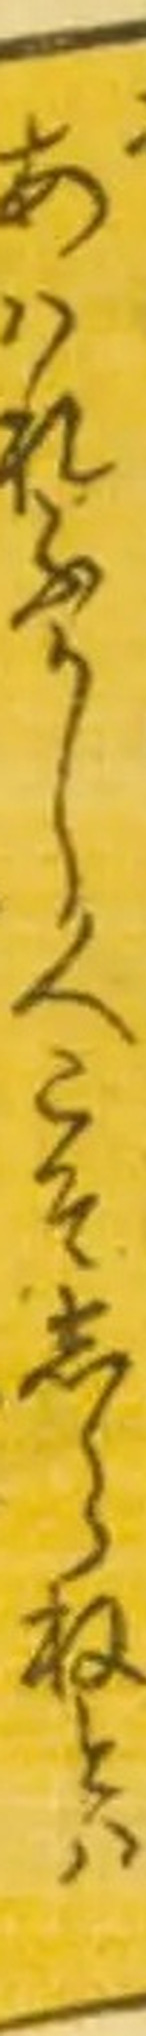あはれふかし人こそしらねとは
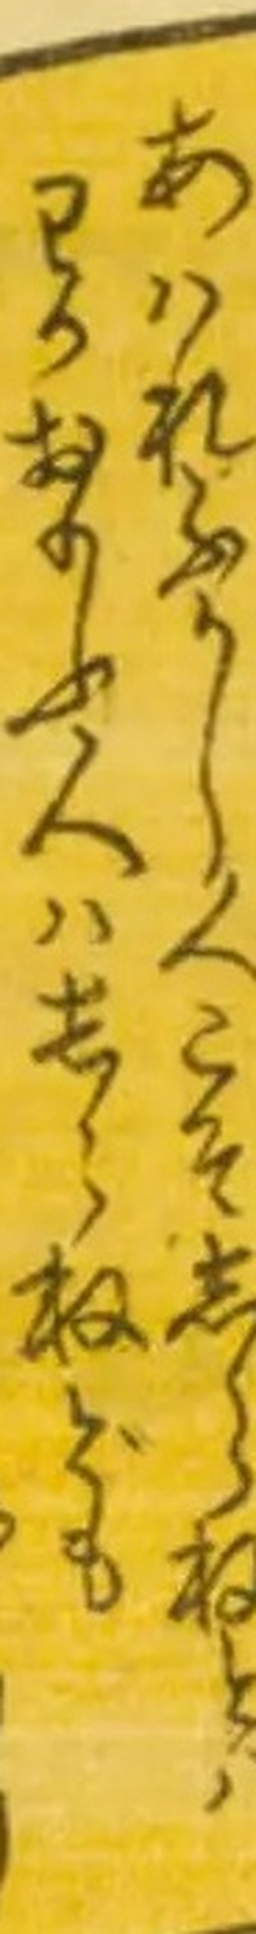わかおもふ人はしらねども
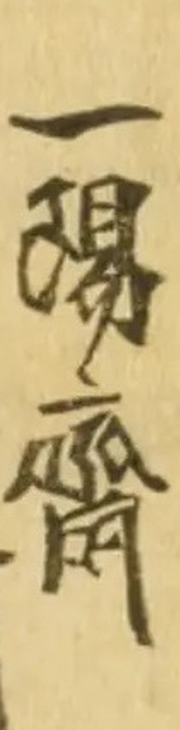一陽斎
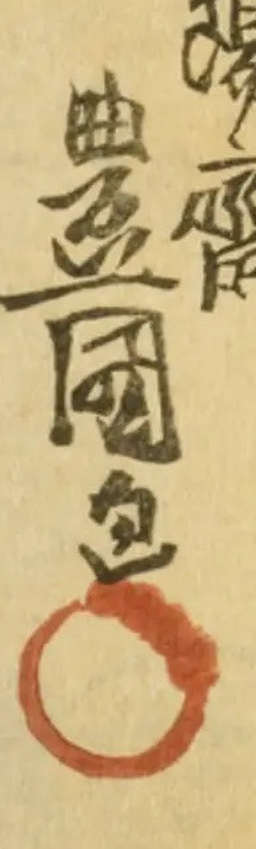豊国画
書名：九十二番 二條院讃岐
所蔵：国立国会図書館 National Diet Library, JAPAN
